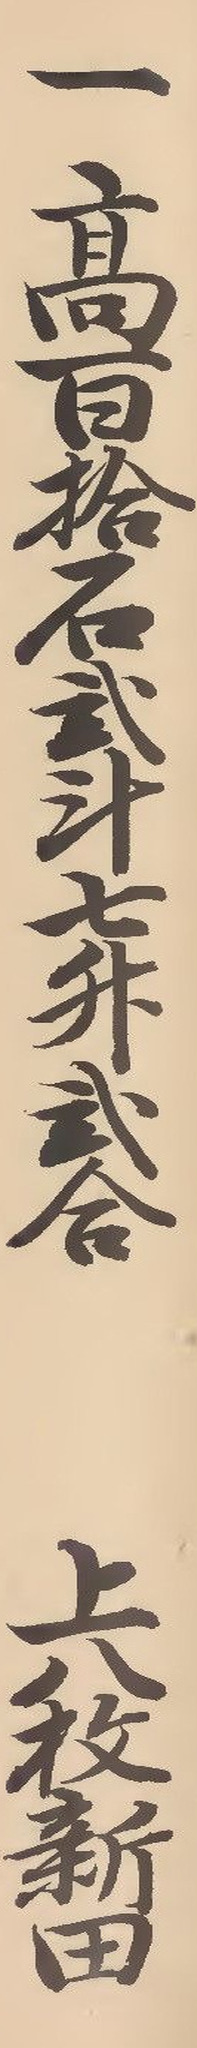一高百拾石弐斗七升弐合上八枚新田
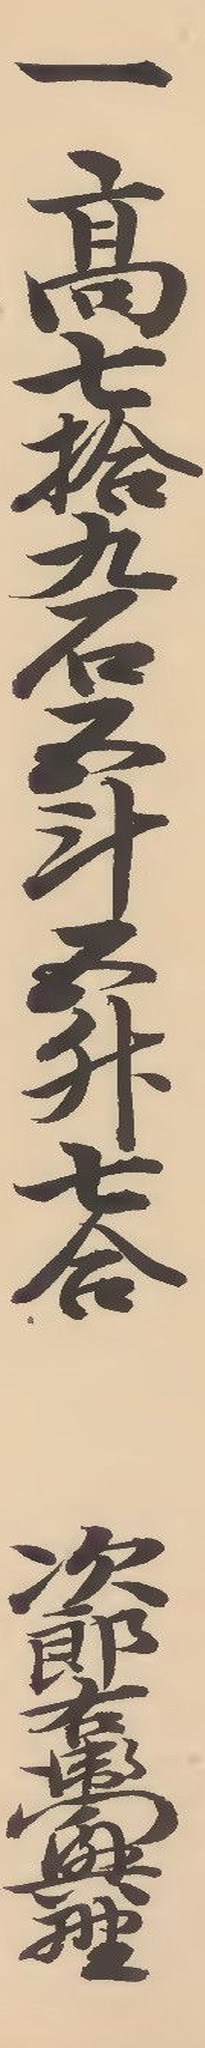一高七拾九石五斗五升七合次郎右衛門興野
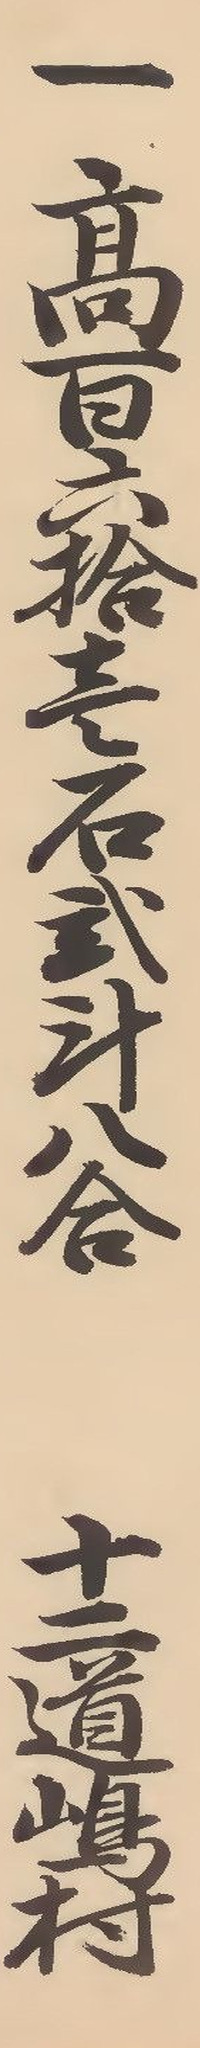一高百六拾壱石弐斗八合十二道島村
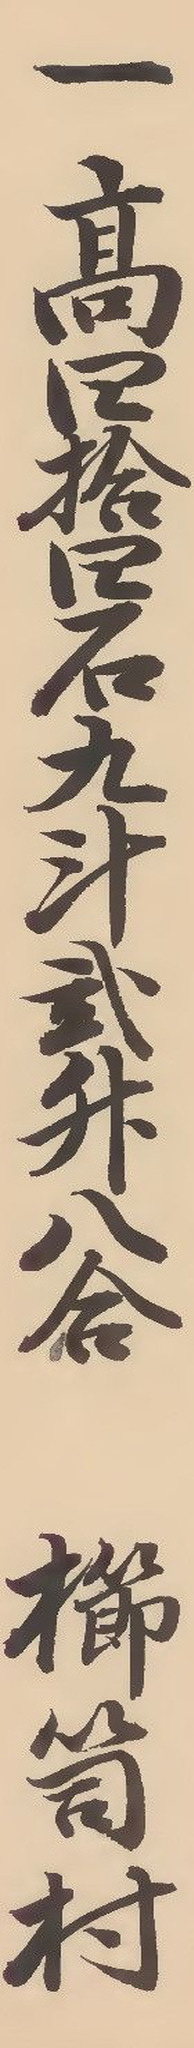一高四拾四石九斗弐升八合櫛笥村

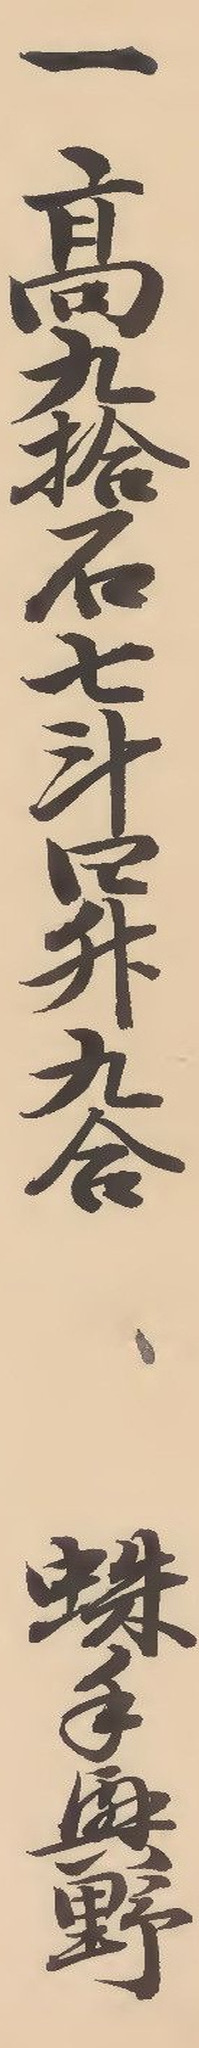一高九拾石七斗四升九合蛛手興野
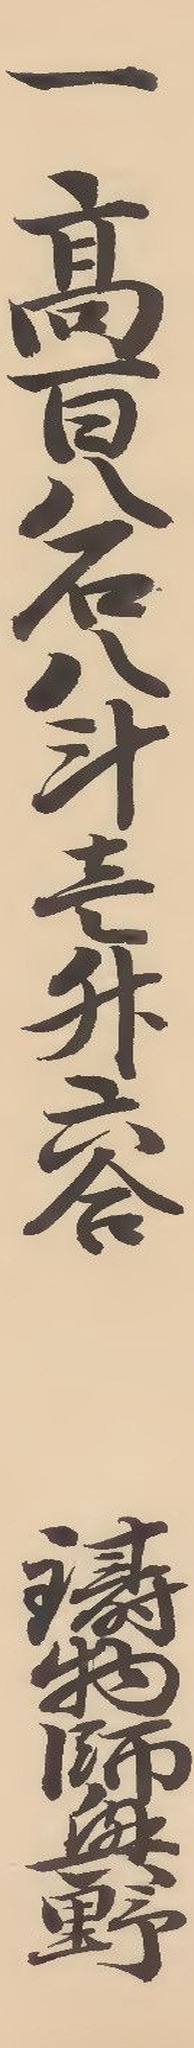一高百八石八斗壱升六合鋳物師興野
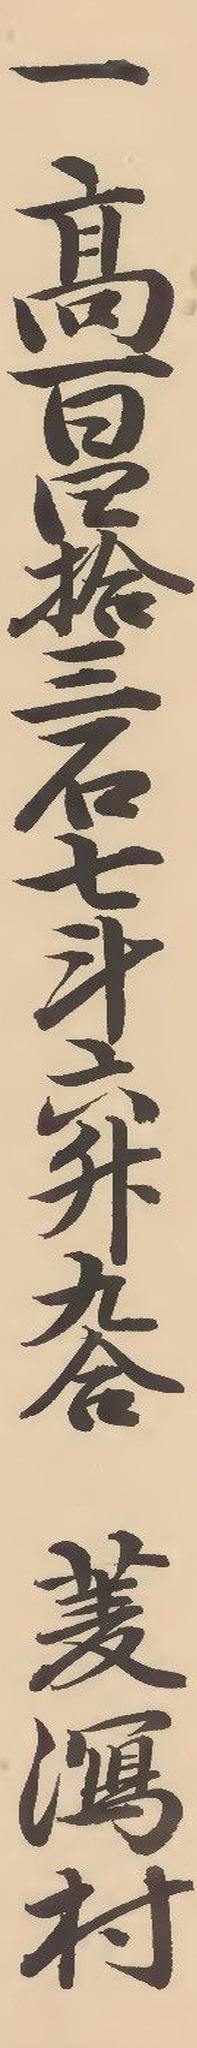一高百四拾三石七斗六升九合菱潟村
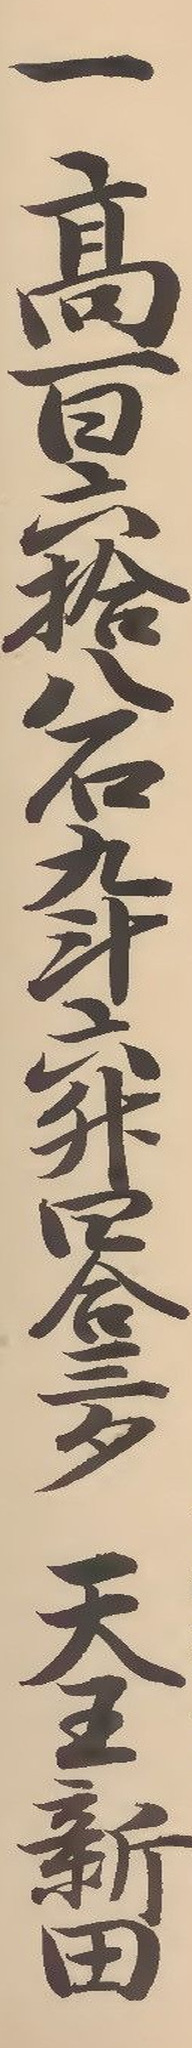一高百六拾八石九斗六升四合三勺天王新田
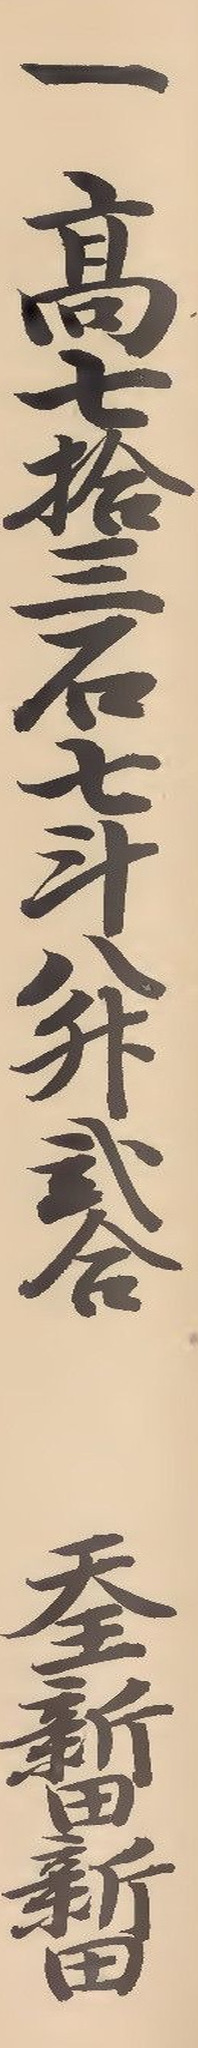一高七拾三石七斗八升弐合天王新田新田
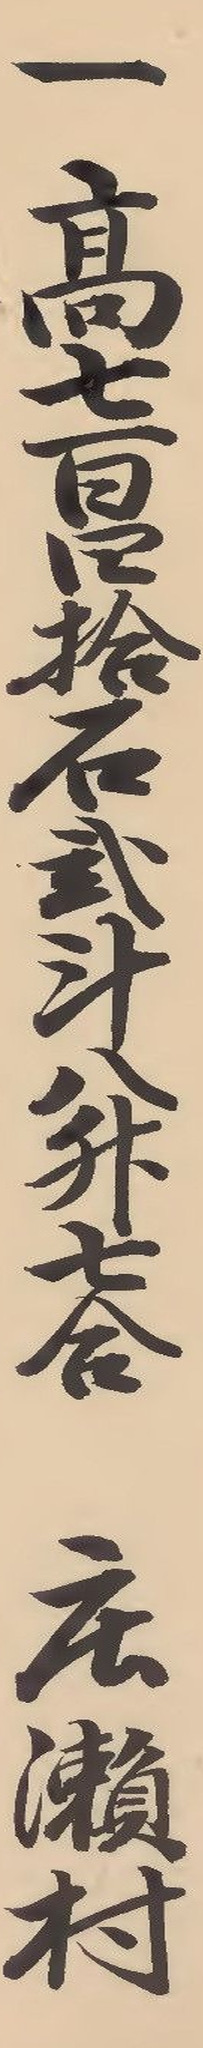一高七百四拾石弐斗八升七合庄瀬村
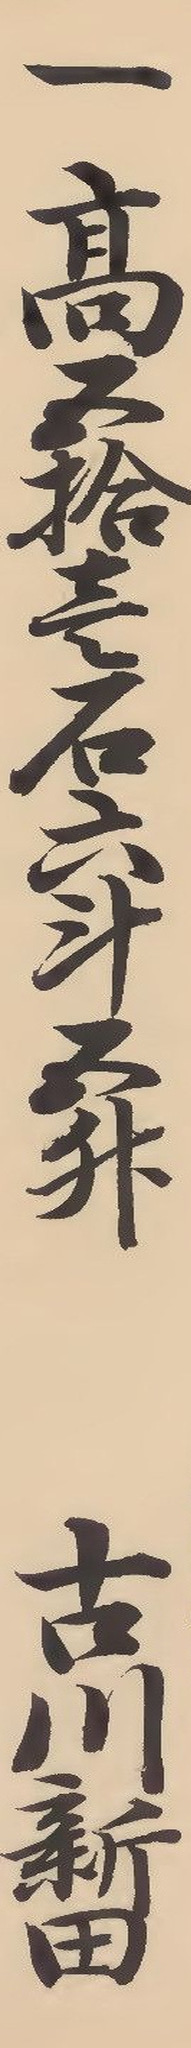一高五拾壱石六斗五升古川新田
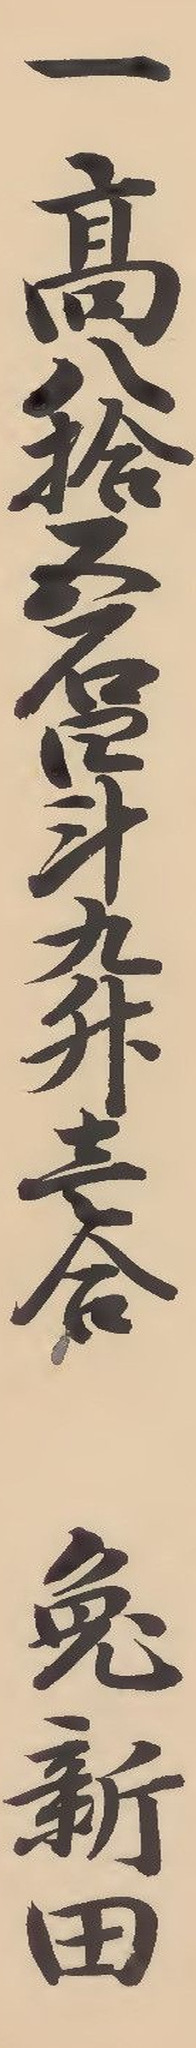一高八拾五石四斗九升壱合兎新田

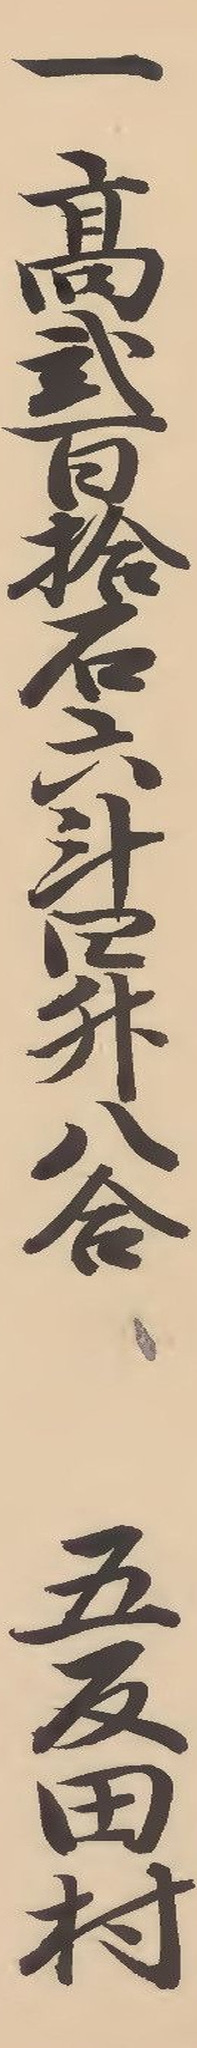一高弐百拾石六斗四升八合五反田村
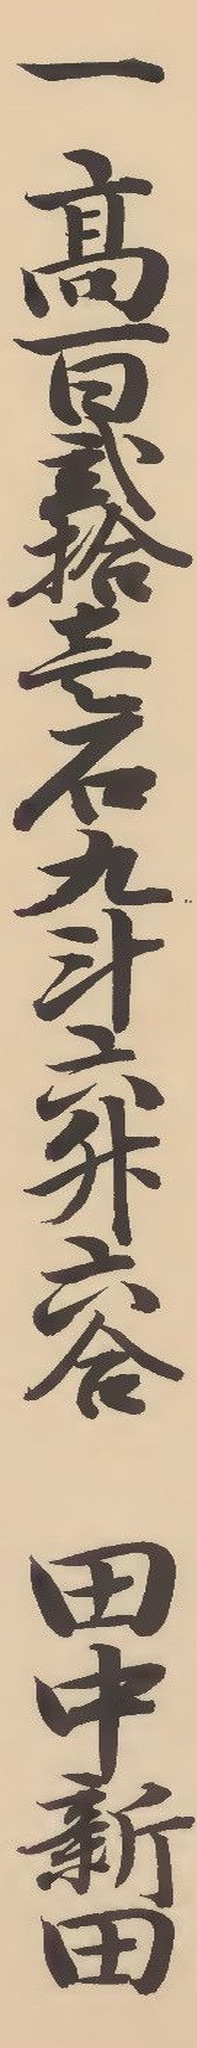一高百弐拾壱石九斗六升六合田中新田
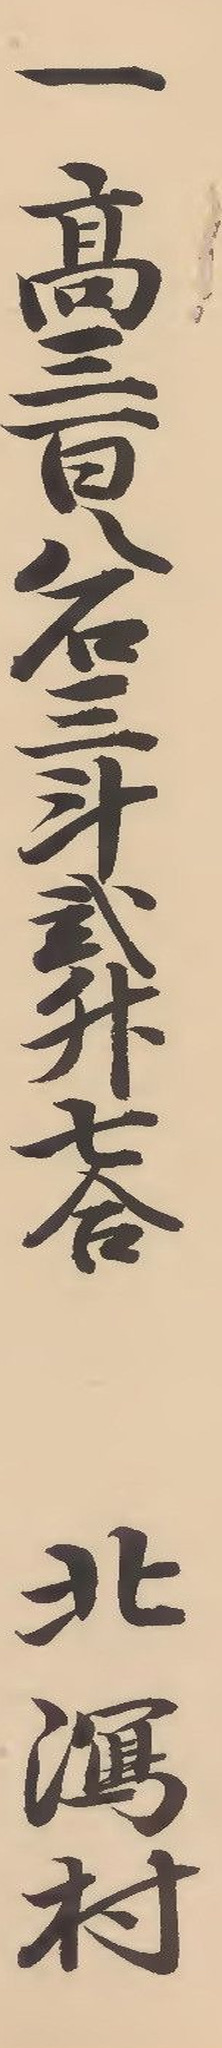一高三百八石三斗弐升七合北潟村
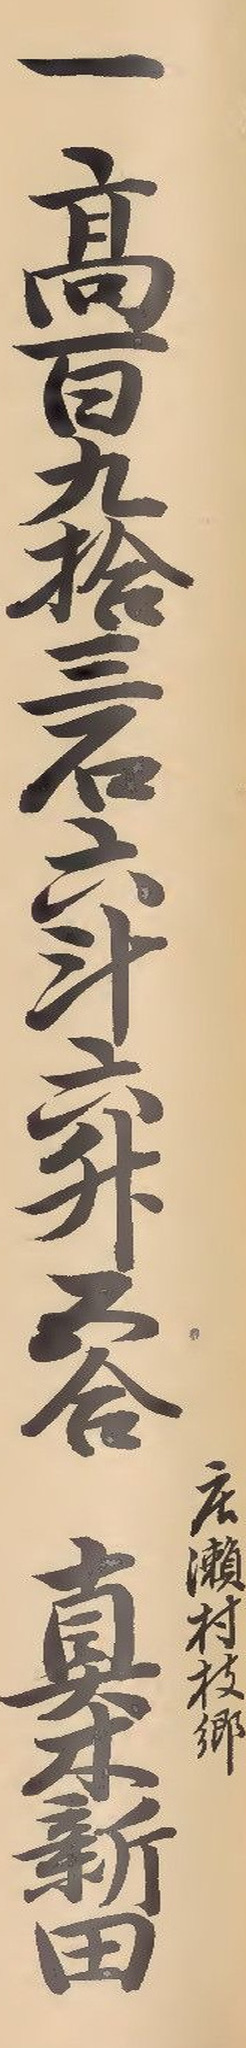一高百九拾三石六斗六升五合真木新田
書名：越後国郷帳　下
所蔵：国立公文書館 National Archives of Japan
